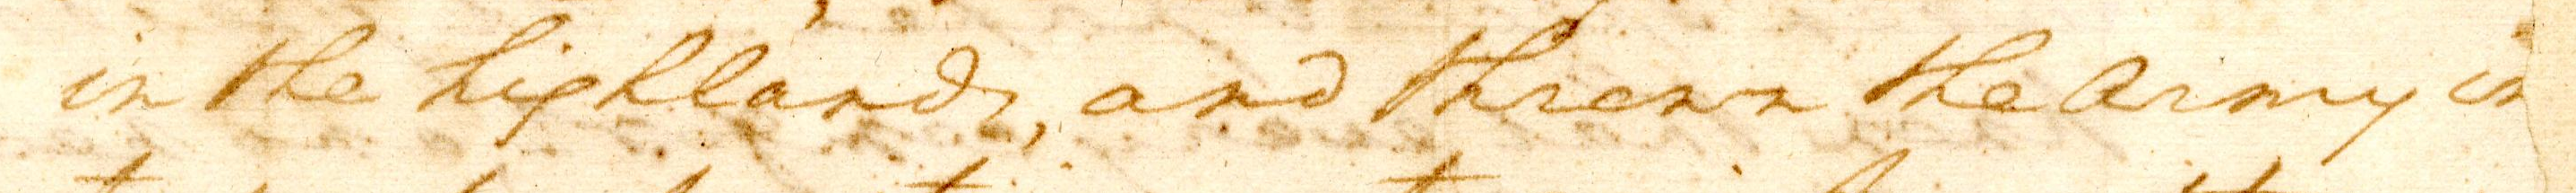in the highlands, and their the army as
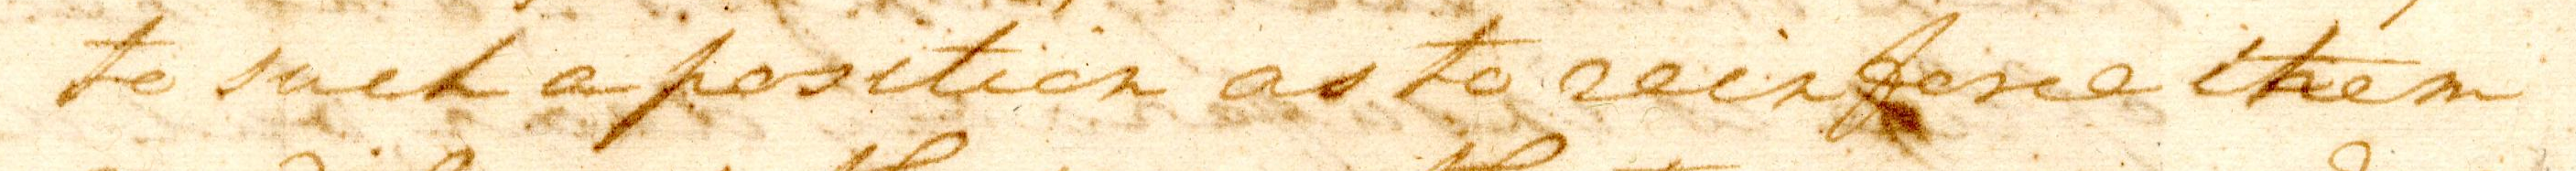be such a position as to reinforce them
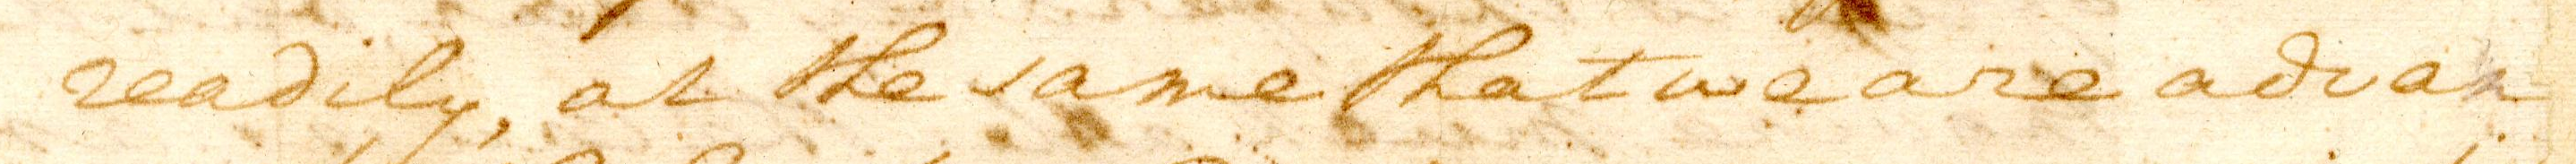readily, at the same that we are advan
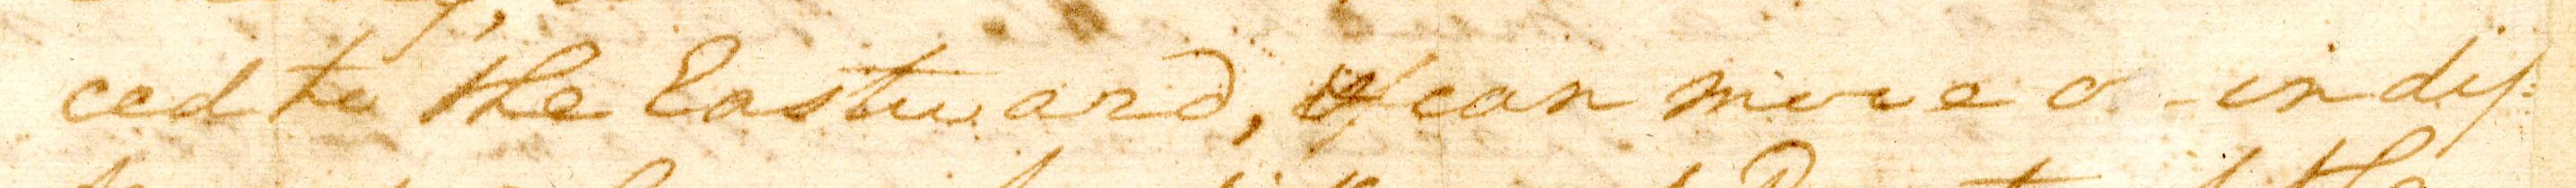ced to the Eastward, & can more or in dif-
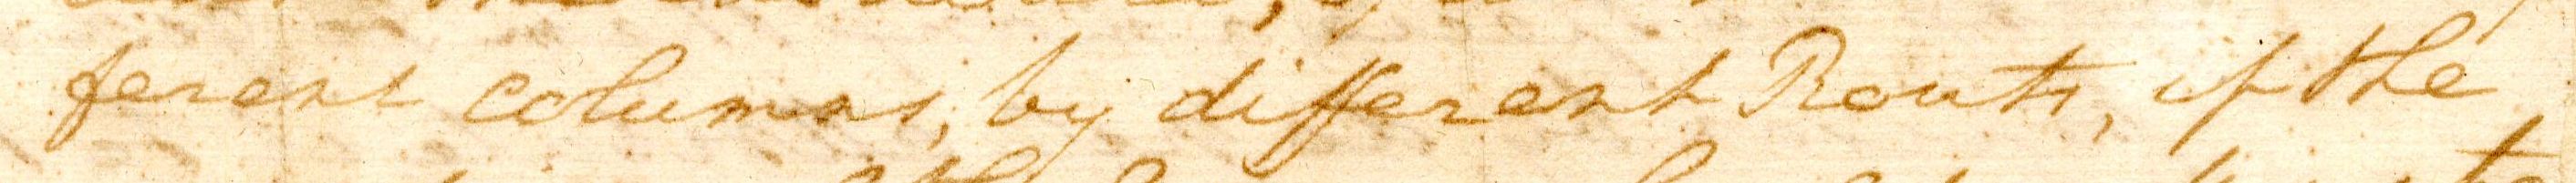ferent collumns, by different Routes, of the
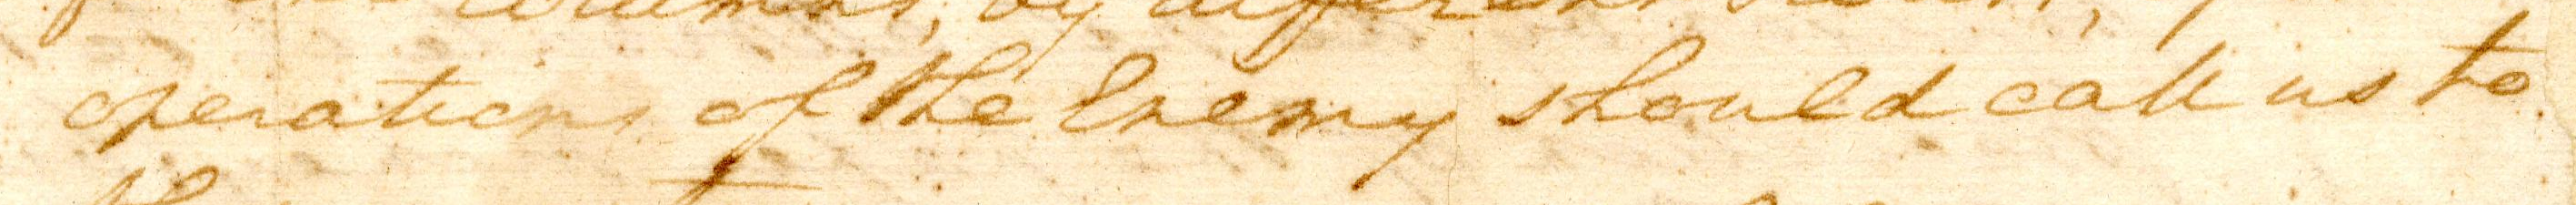operations of the Enemy should call us to
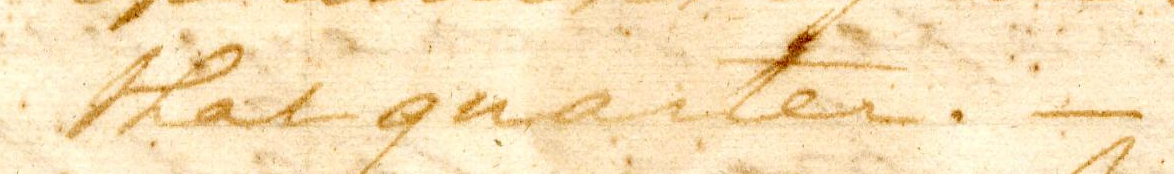that quarter.-
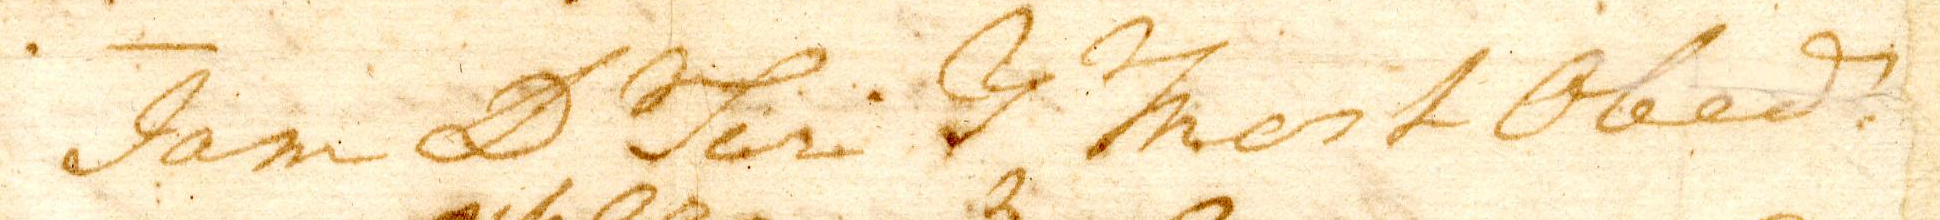I am D^r Sir Y^r most Obed^t.
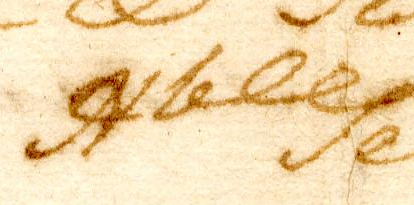H^ble
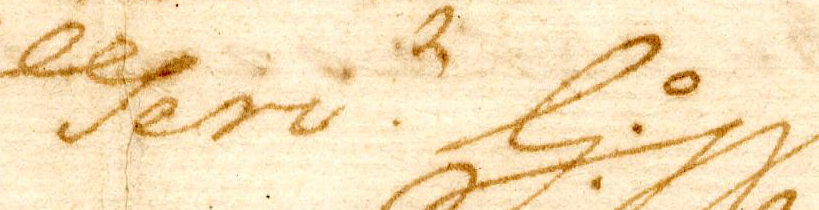Serv^t. G^o:
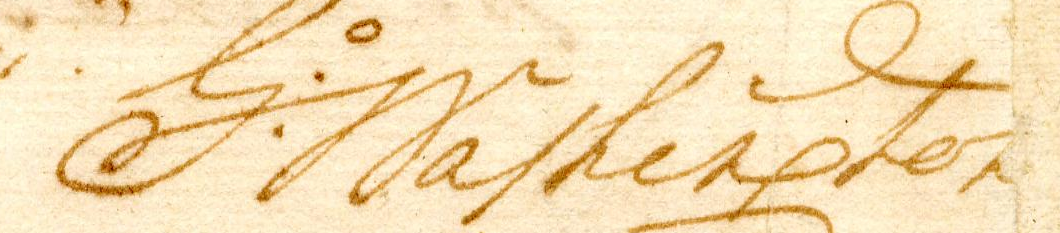Washington
